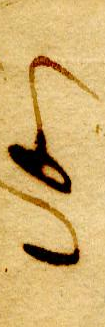To
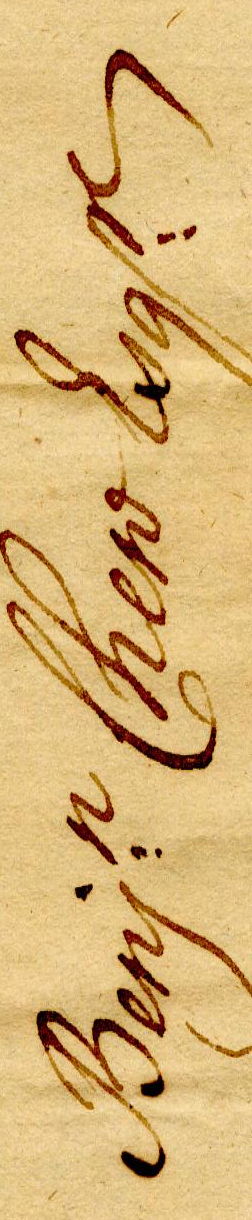Ben^n. Chew Esq^r.
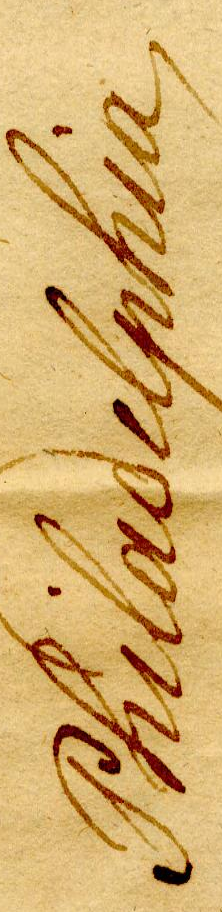Philadelphia
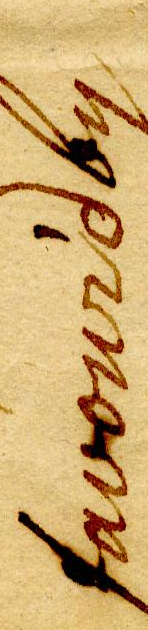favour'd by
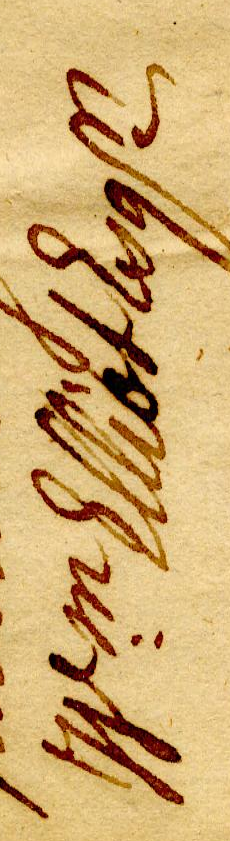W^m. Elliot Esq^r.
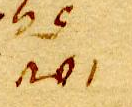100
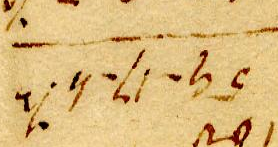59-17-4 1/2
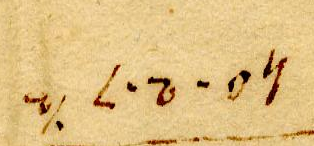40-2-7 1/2
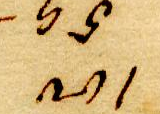100
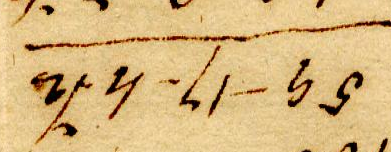59-17-4 1/2
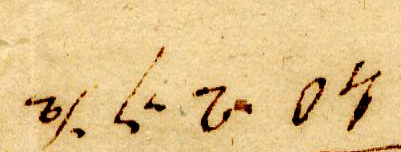40 -2 -7 1/2
